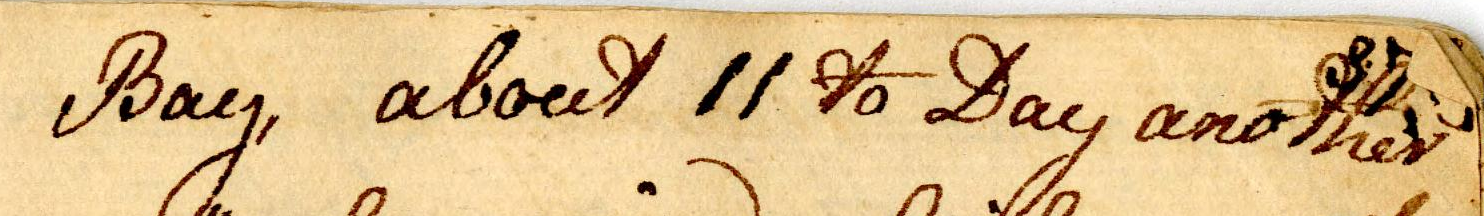Bay, about 11 to Day another
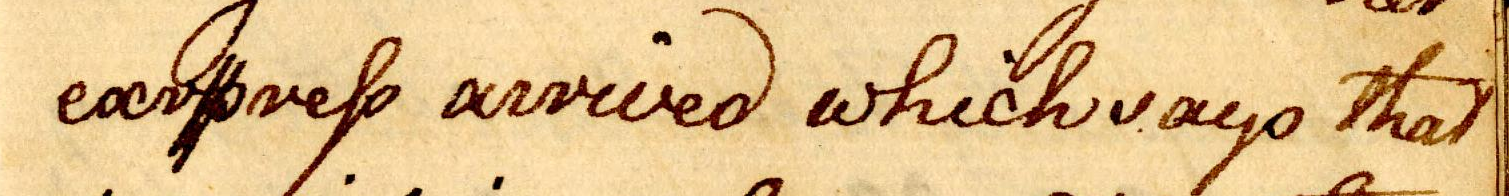exrpress arrived which says that
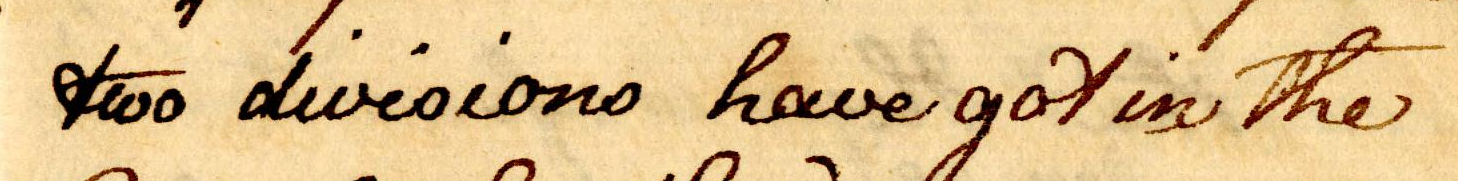two divisions have got in the
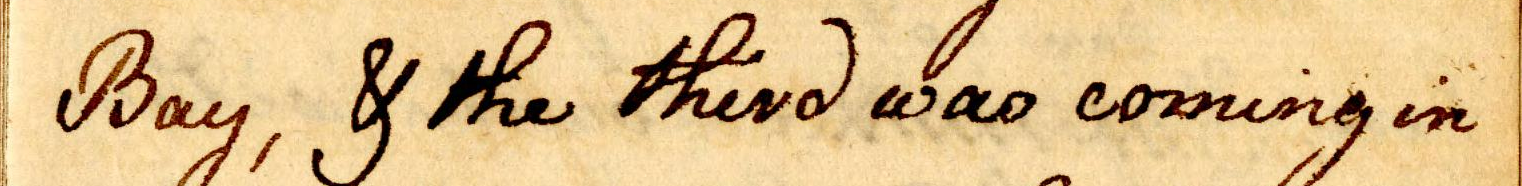Bay, & the third was coming in
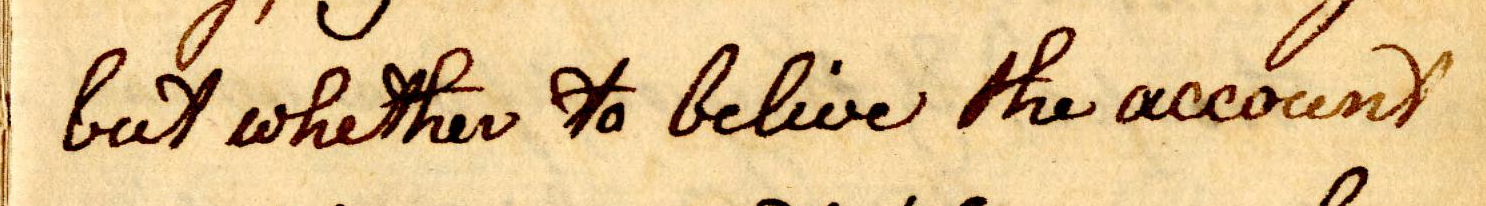but whether to belive the account
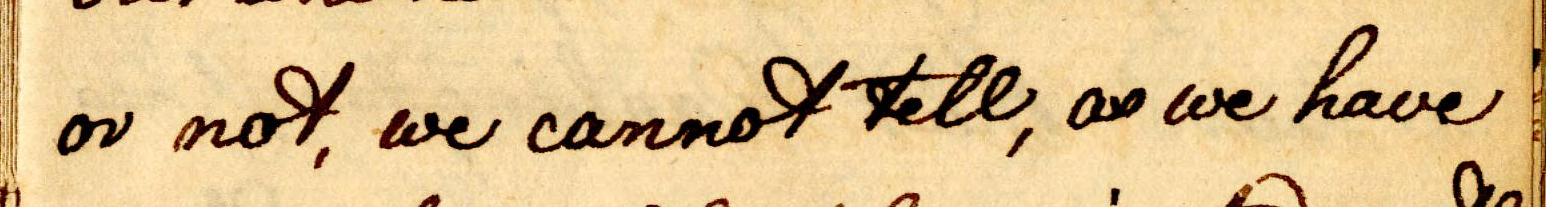or not, we cannot tell, as we have
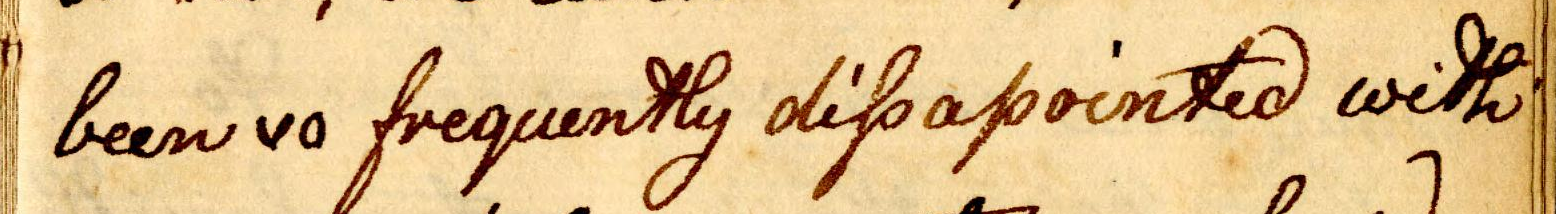been so frequently dissapointed with
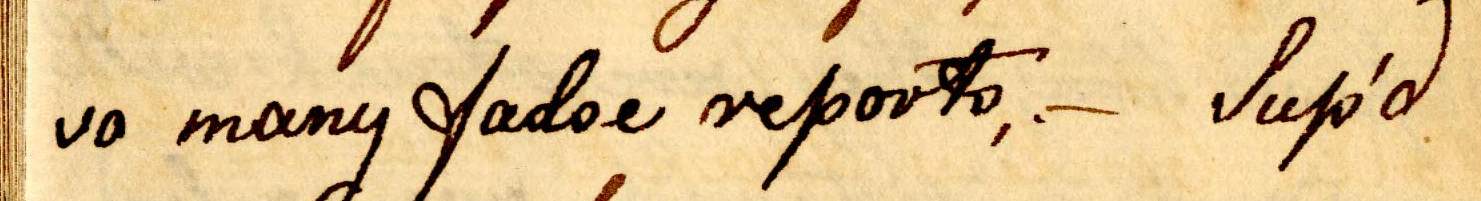so many false reports,- Sup'd
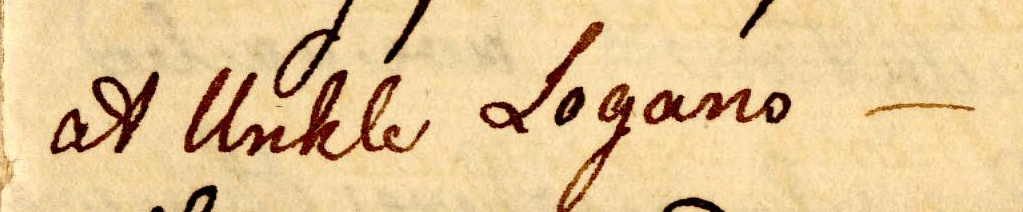at Unkle Logans-
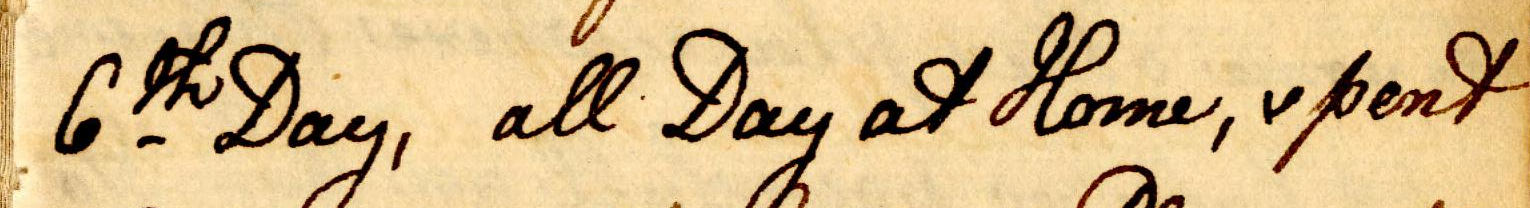6^th Day, all Day at Home, spent
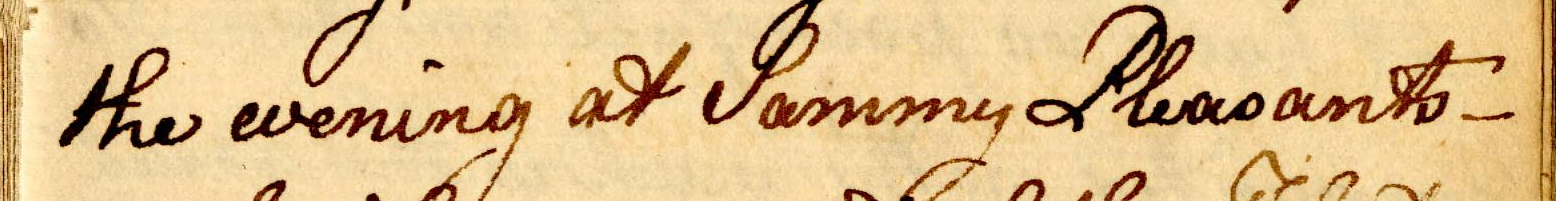the evening at Sammy Pleasants-
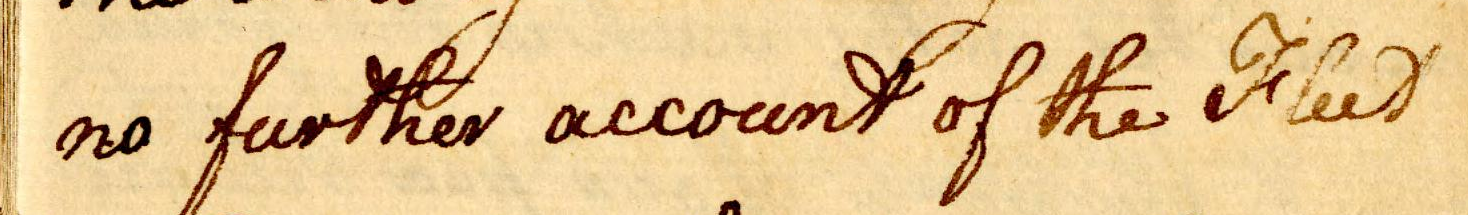no further account of the Fleet
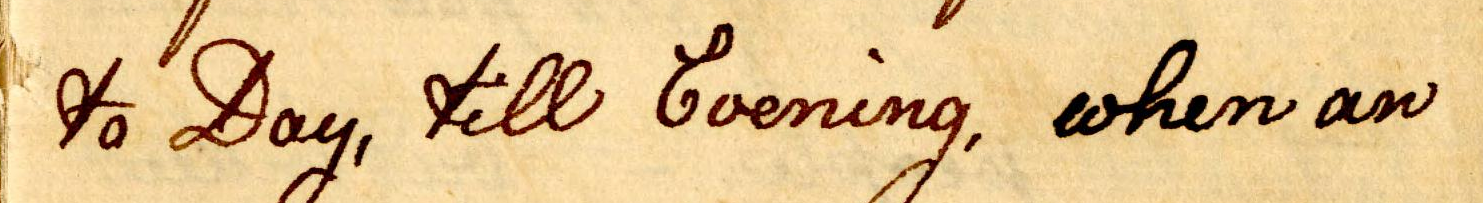to Day, till Evening, when an
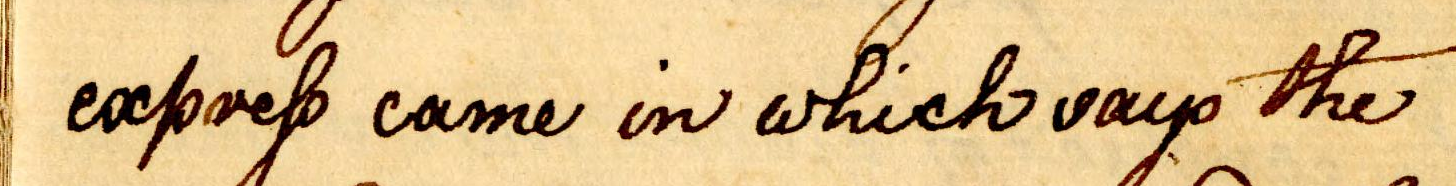express came in which says the
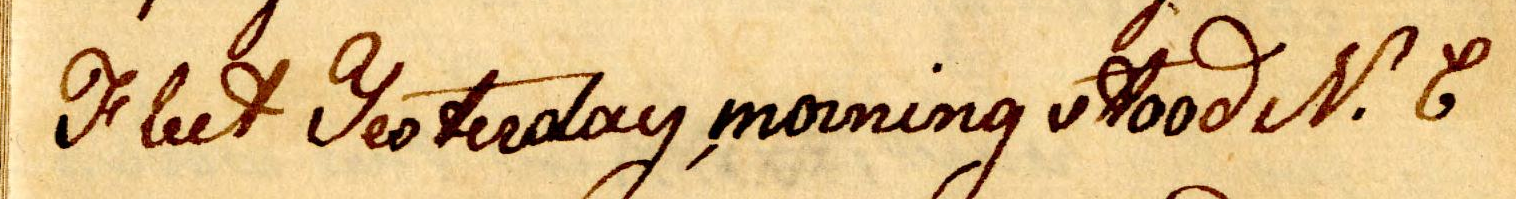Fleet Yesterday, morning stood N. E
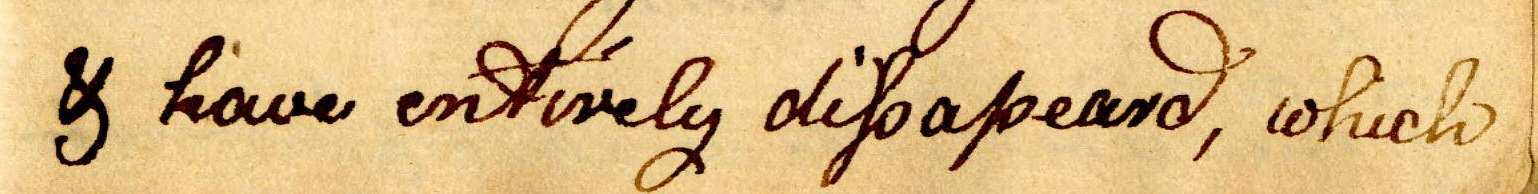& have entirely dissapeard, which
